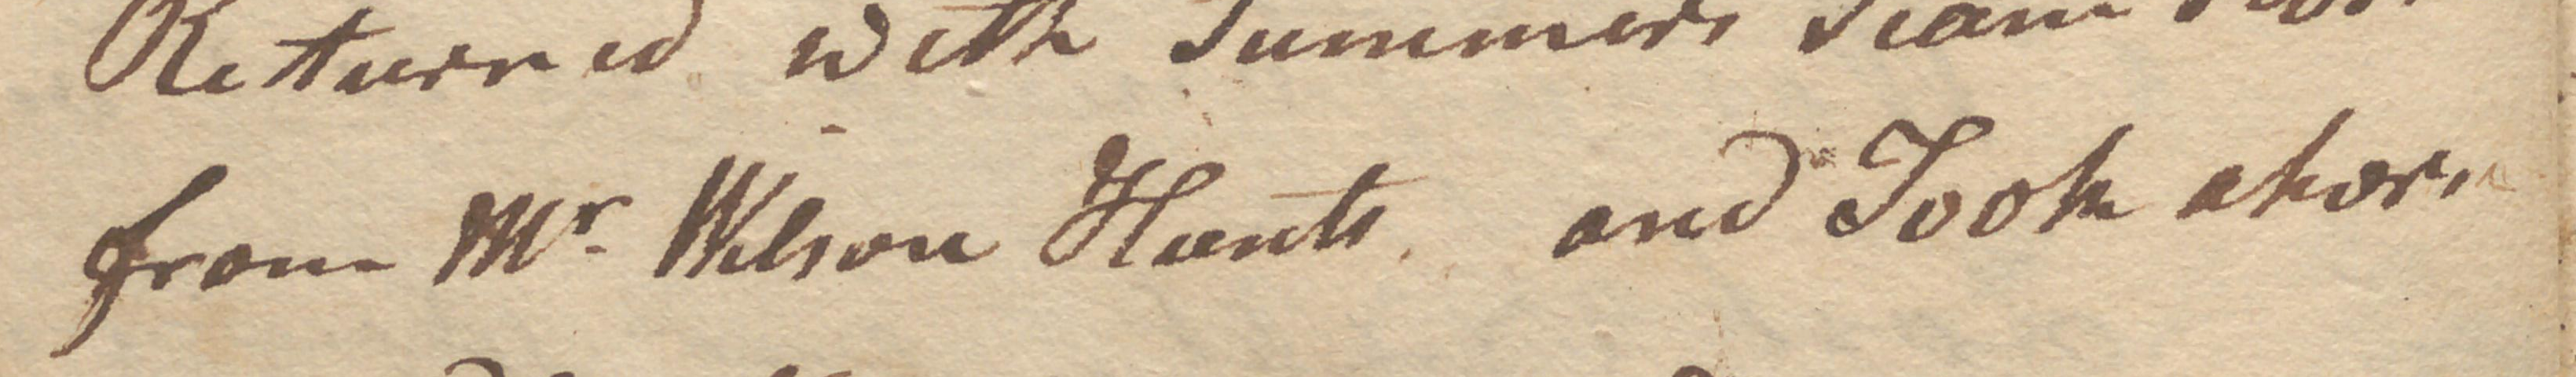from M^r. Wilson Hunts, and Took a horse
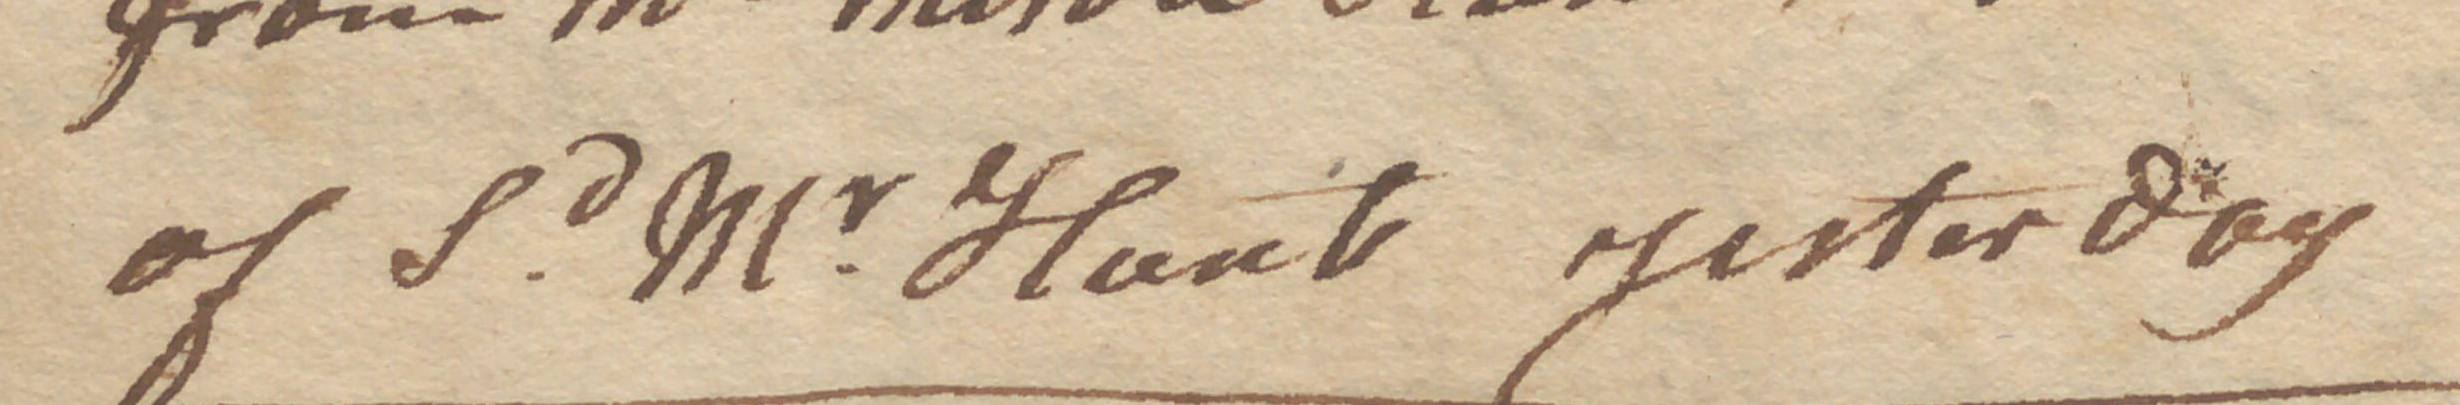of s^d. M^r. Hunt yesterday
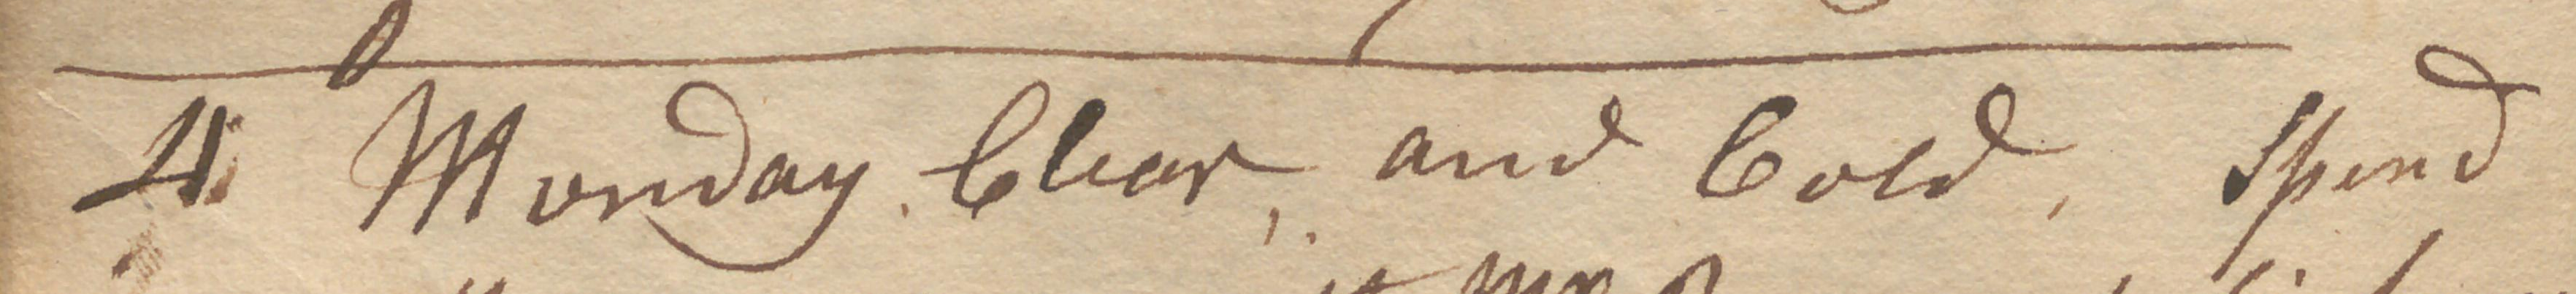4 Monday Clear and Cold, spend
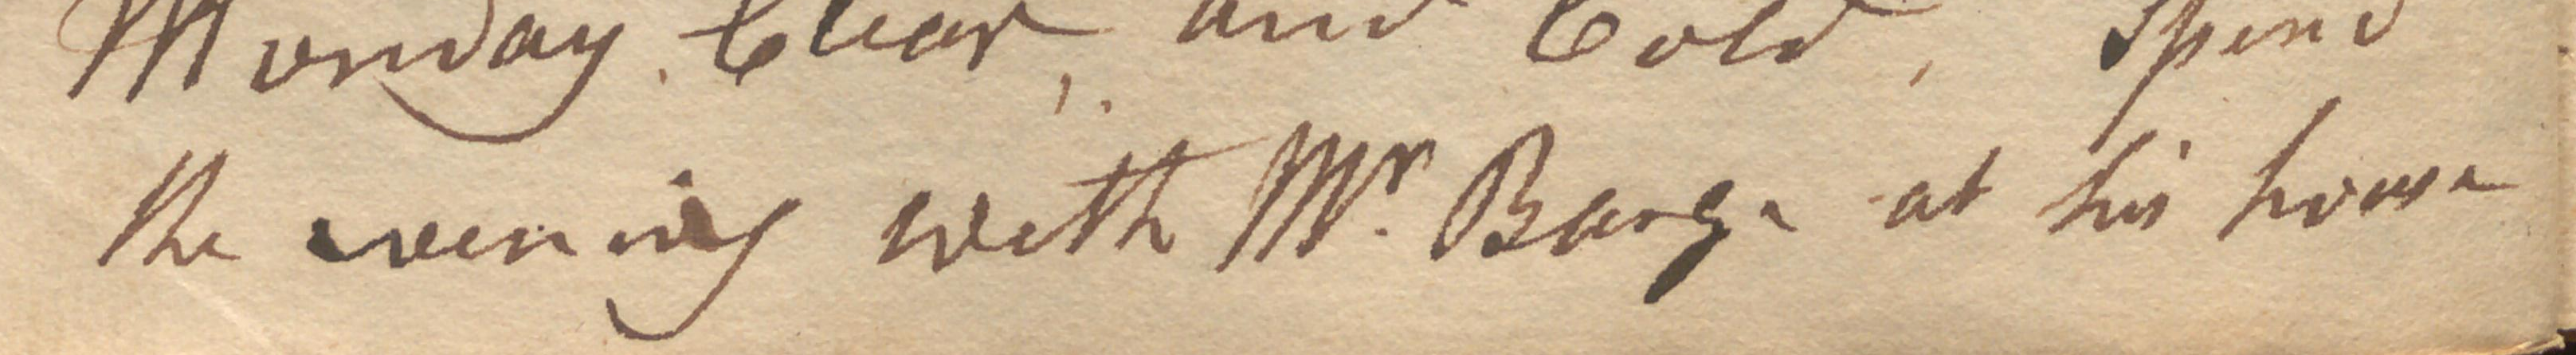the evening with M^r. Barge at his house
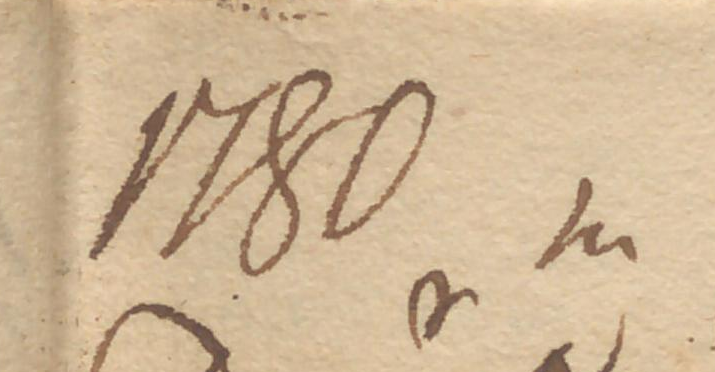1780
